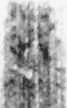弩弓
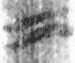二
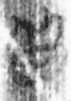皆
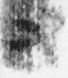又（有）
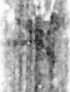又（有）
